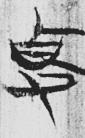史（使）
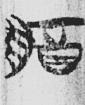𨟻（將）
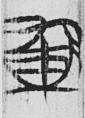軍
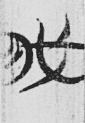我
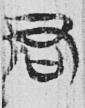君
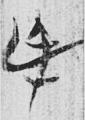身
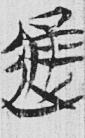進
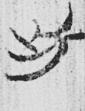此
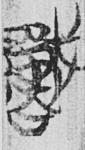○（戰）
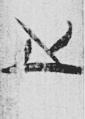之
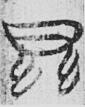○（顯）
